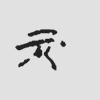亓（其）
